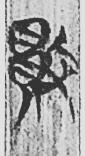敗
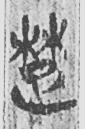楚
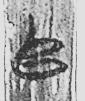𠂤
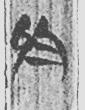於
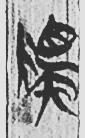{阜目S目內}
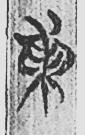{木𦥑}
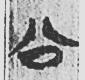公
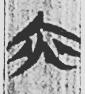亦
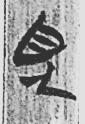見
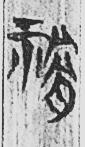禍
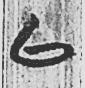㠯（以）
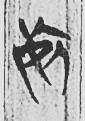死
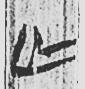亡
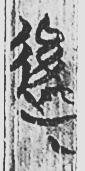復
